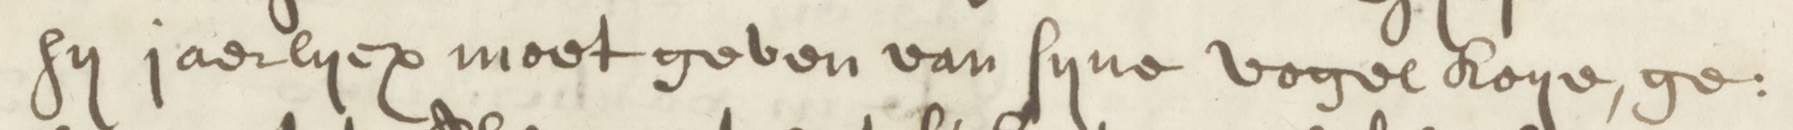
hy jaerlycx moet geven van syne Vogel koye, ge„
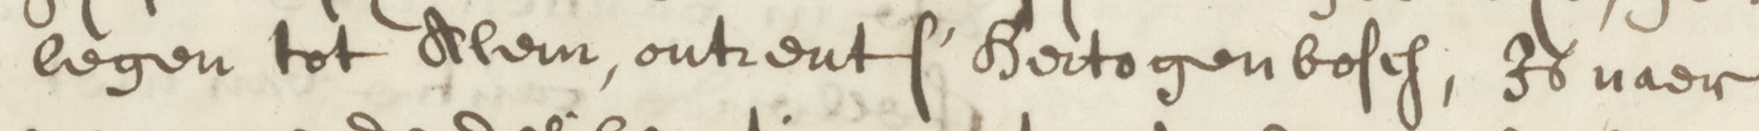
legen tot Alem, ontrent s'Hertogenbosch, Is naer
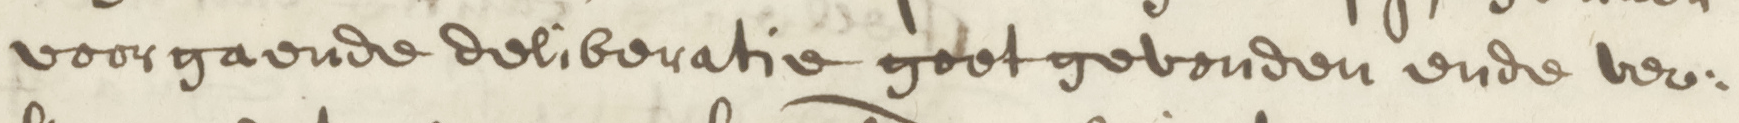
voorgaende deliberatie goetgevonden ende ver,,
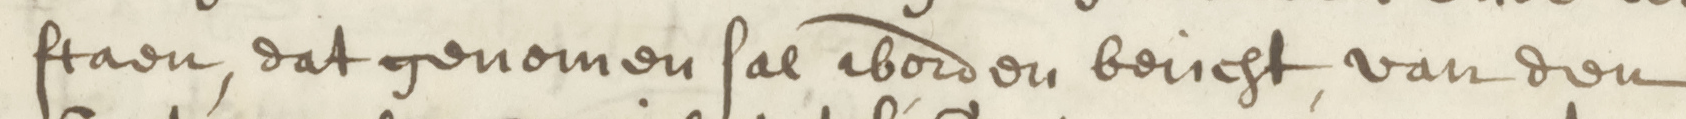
staen, dat genomen sal worden bericht van den
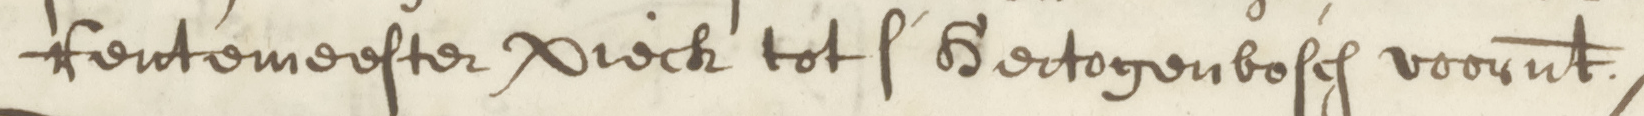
Rentemeester Pieck tot s'Hertogenbosch voornt.
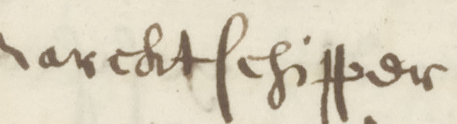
Marcktschipper
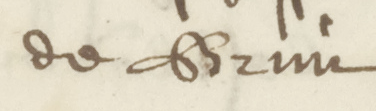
de Brun.
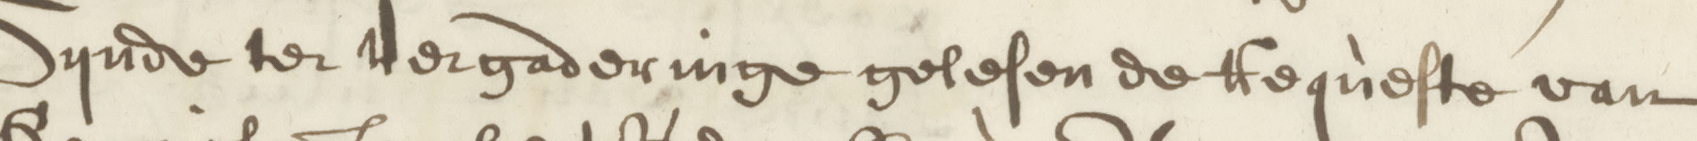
Synde ter Vergaderinge gelesen de Requeste van
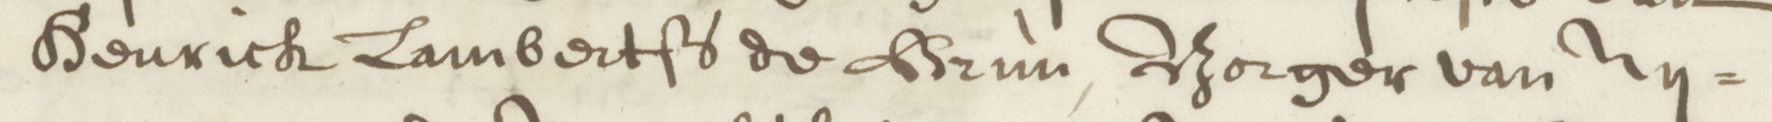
Henrick Lambertsz de Brun, Borger van Ny=
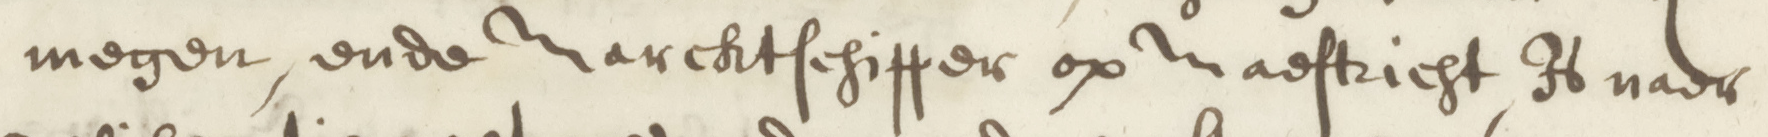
megen, ende Marcktschipper op Maestricht, Is naer
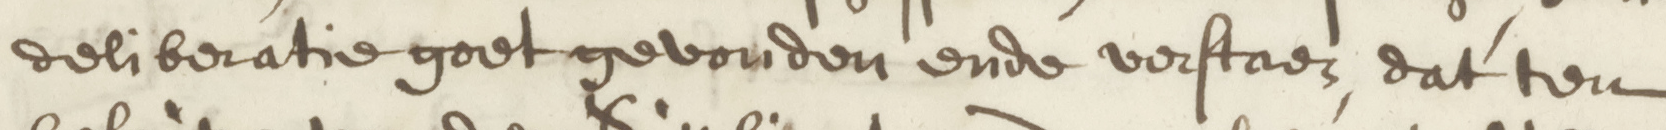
deliberatie goetgevonden ende verstaen, dat ten
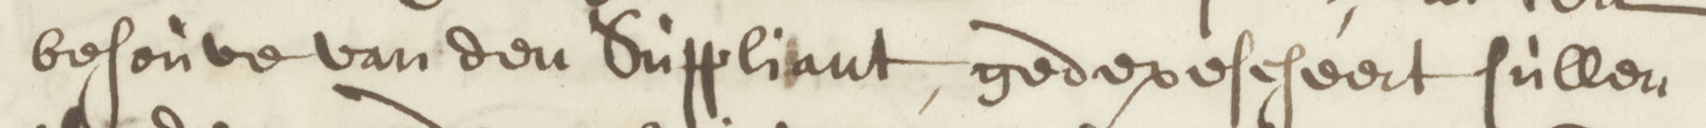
behouve van den Suppliant, gedepescheert sullen
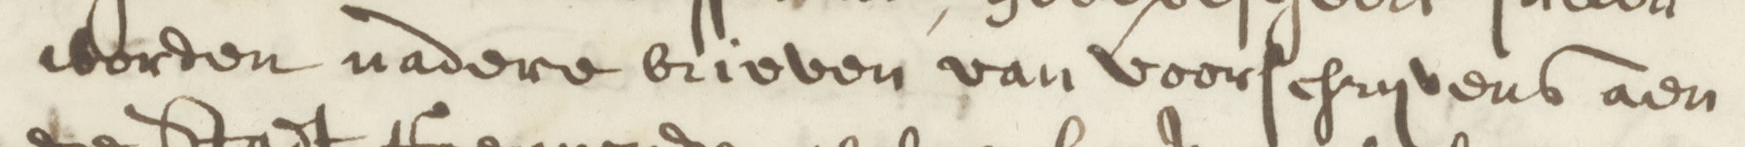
worden nadere bieven van voorschryvens aen
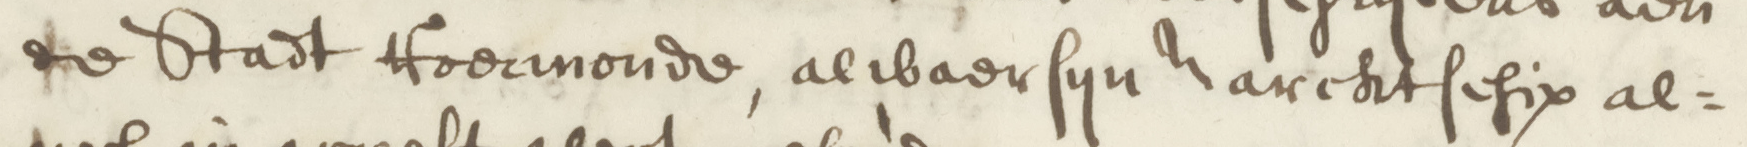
de Stadt Roermonde, alwaer syn Marcktschip al=
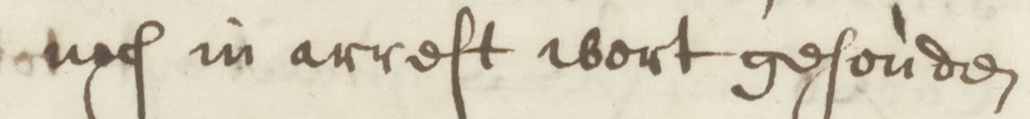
noch in arrest wert gehouden
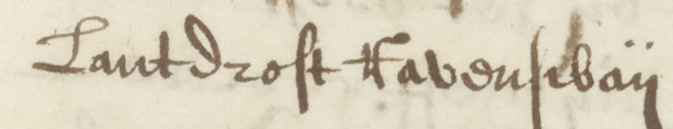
Lantdrost Ravenswaij
